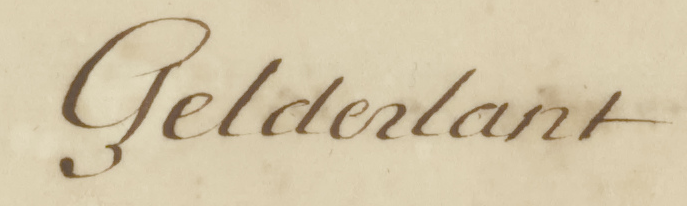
Gelderlant
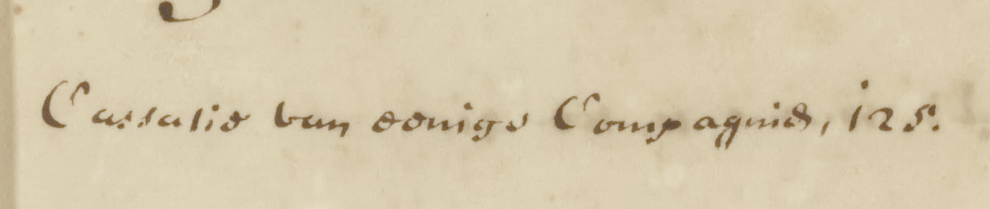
Cassatie van eenige Compagnien, 125.
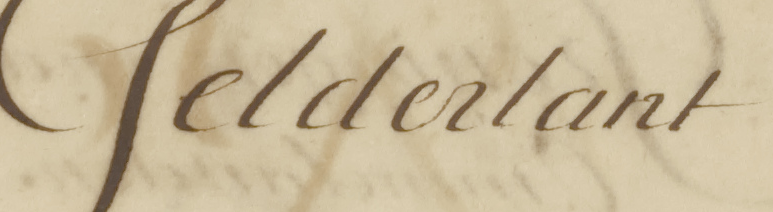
Gelderlant
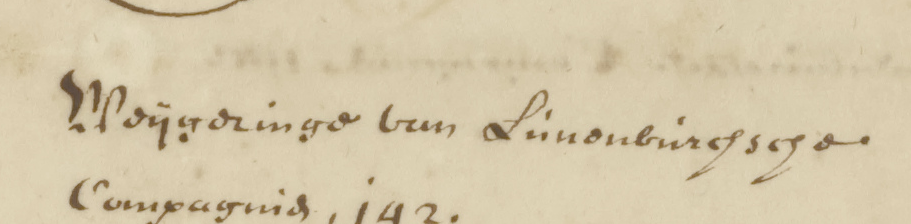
Weijgeringe van Lunenburchsche
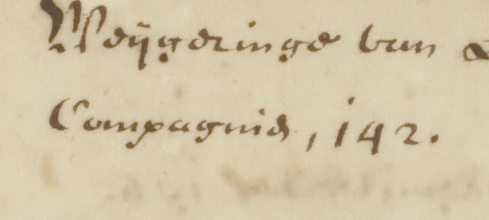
Compagnien, 142.
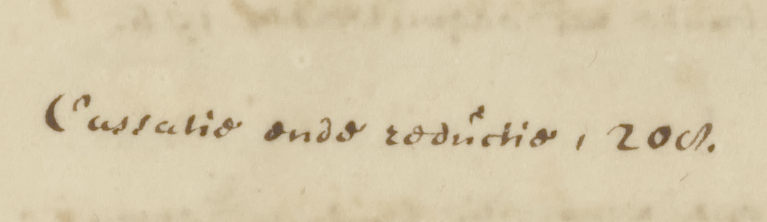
Cassatie ende reductie, 208.
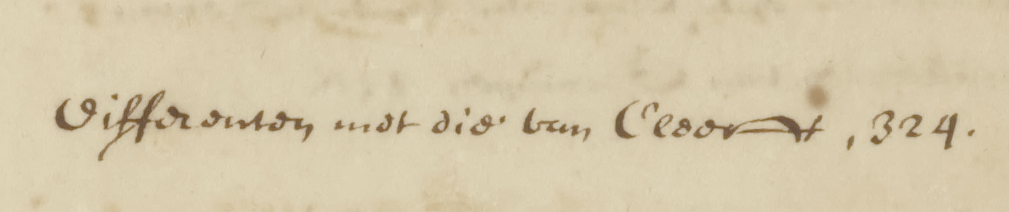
Differenten met die van Cleeff, 324.
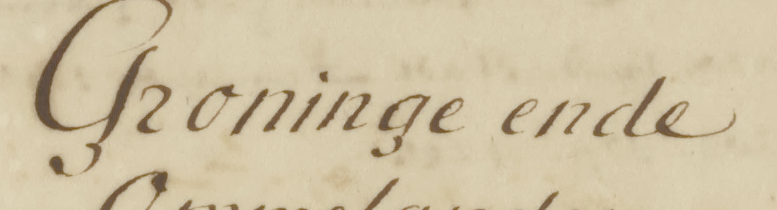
Groninge ende
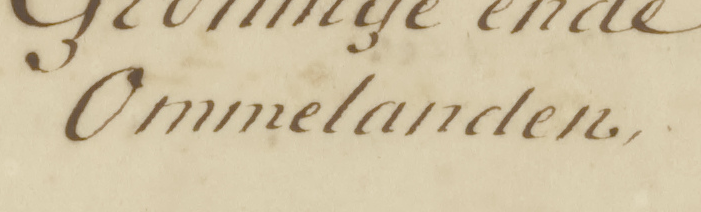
Ommelanden,
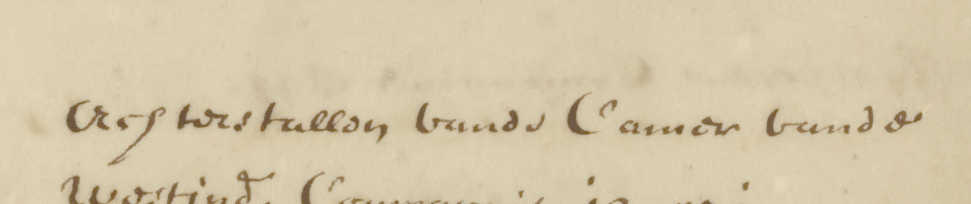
Achterstallen vande Camer vande
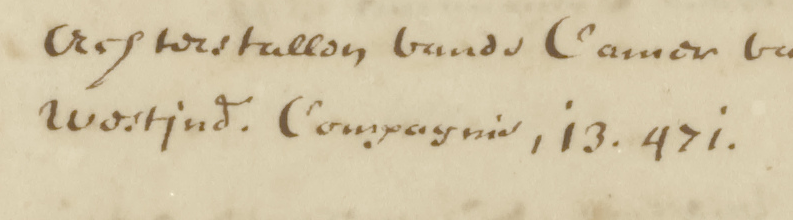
Westind. Compagnie, 13. 471.
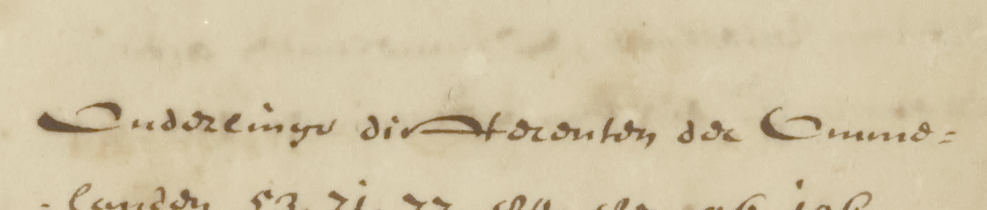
Onderlinge differenten der Omme„
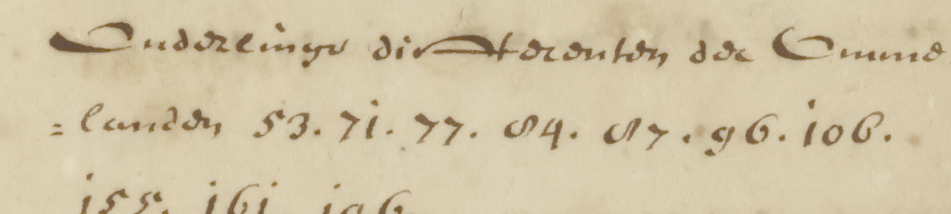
„landen 53. 71. 77. 84. 87. 96. 106.
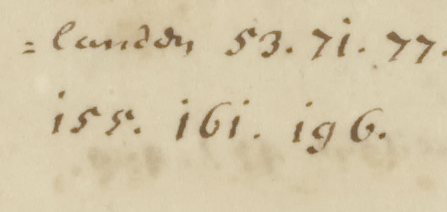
155. 161. 196.
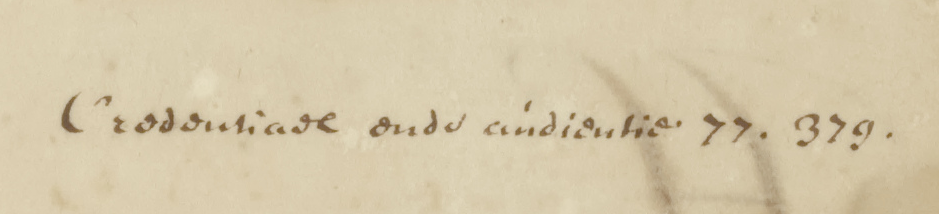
Credentiael ende audientie 77. 379.
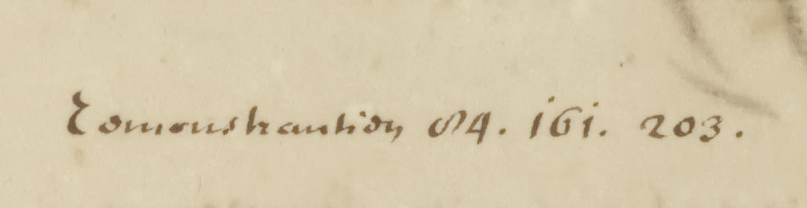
remonstrantien 84. 161. 203.
